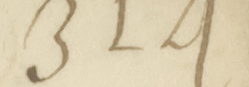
314
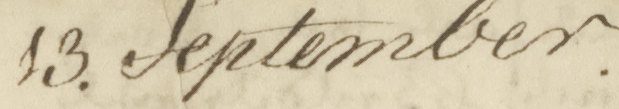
13. September.
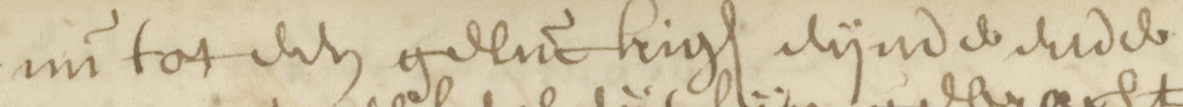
nu tot een geluckigh eijnde ende
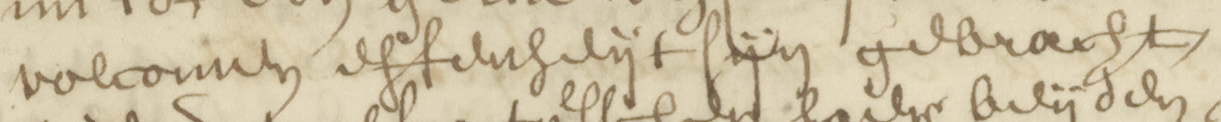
volcomen effenheijt sijn gebracht,
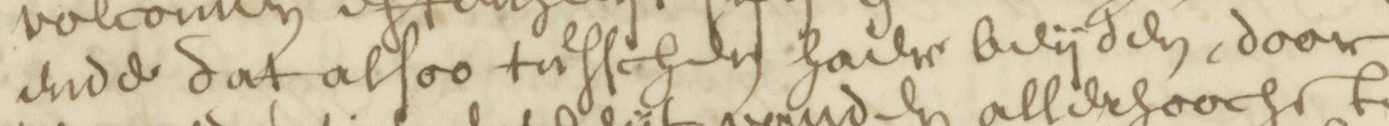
ende dat alsoo tusschen haer beijden, door
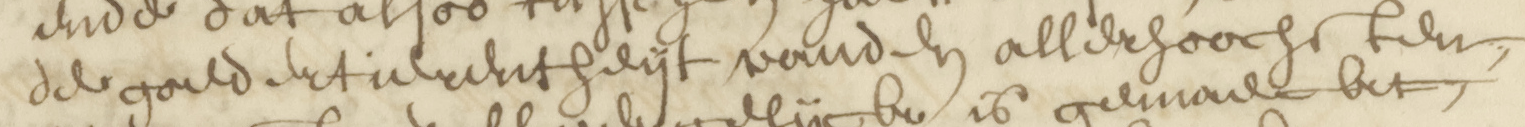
de goedertierentheijt vanden allerhoochsten,
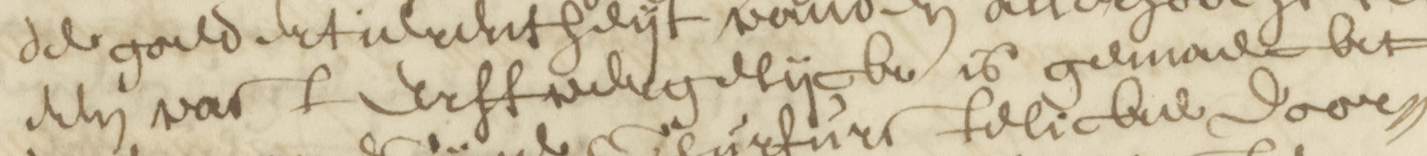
een vast Erffvergelijck is gemaeckt
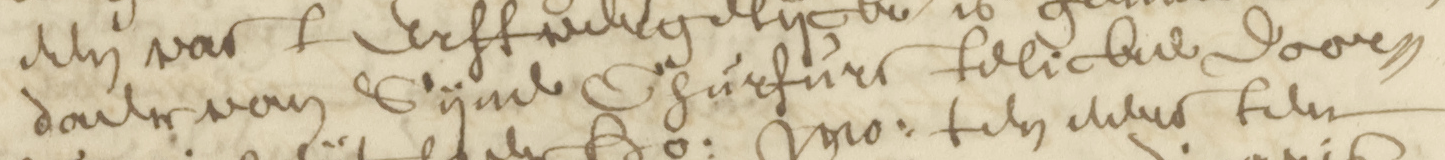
daer van Sijne Churfurstelicke Door,,
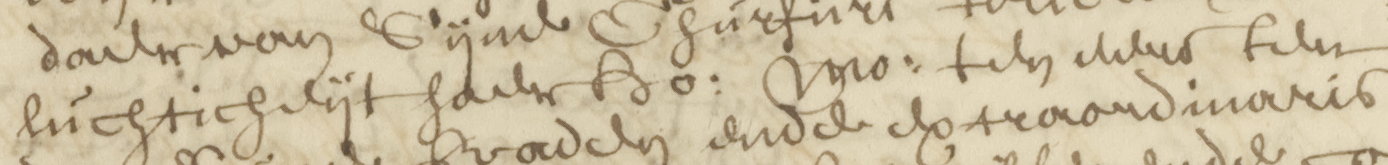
luchticheijt haer Ho:Mo: ten eersten
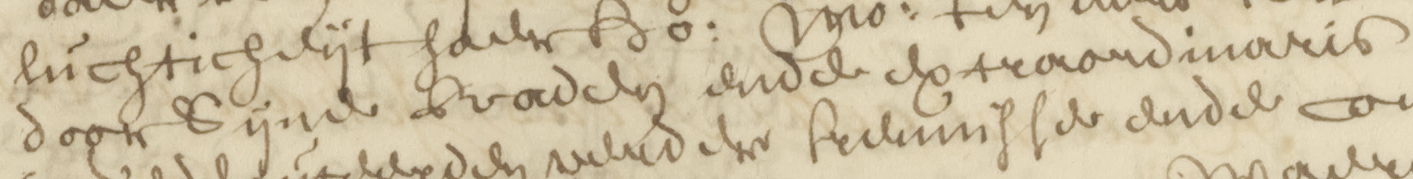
door Sijne Raden ende extraordinaris
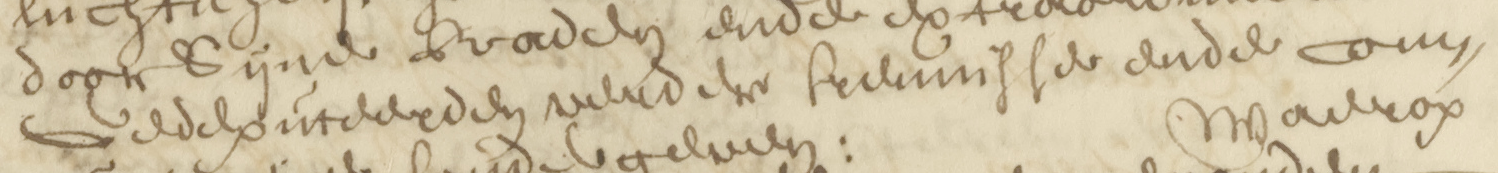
Gedeputeerden verder kennisse ende com„
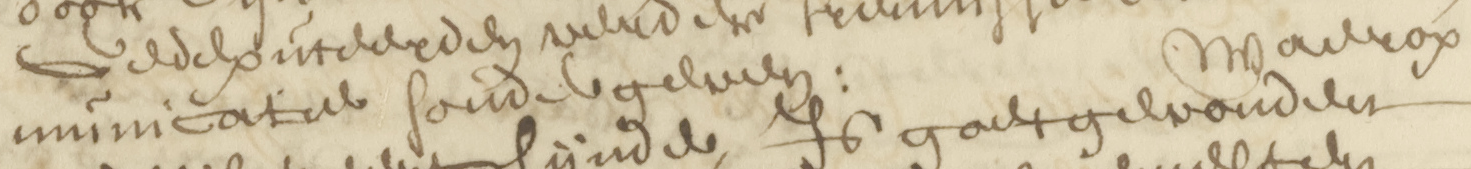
municatie soude geven: Waerop
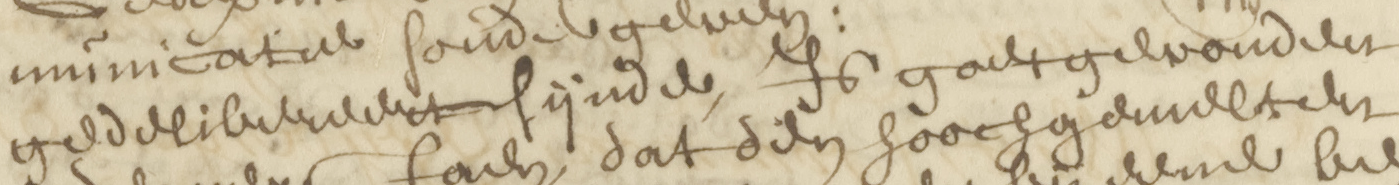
gedelibereert sijnde, Is goetgevonden
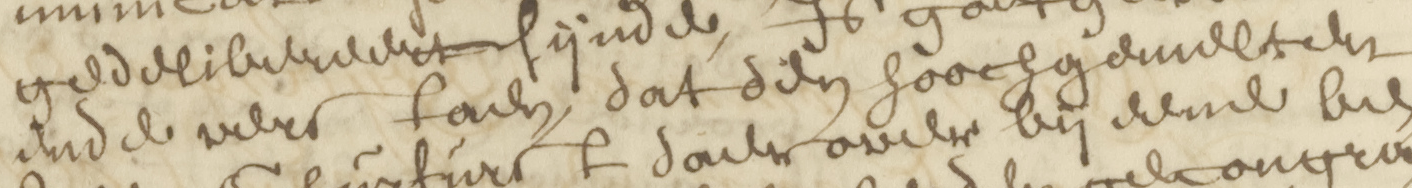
ende verstaen, dat den hoochgemelten
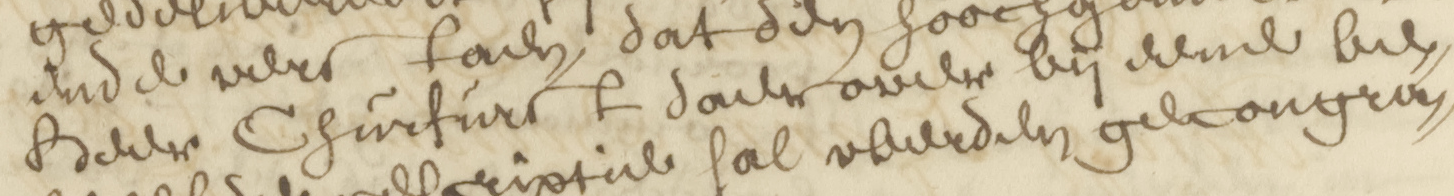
Heer Churfurst daerover bij eene be„,
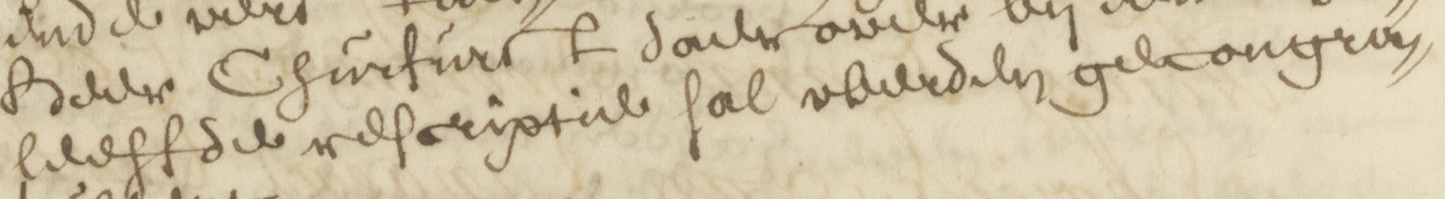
leeffde rescriptie sal werden gecongra,,
